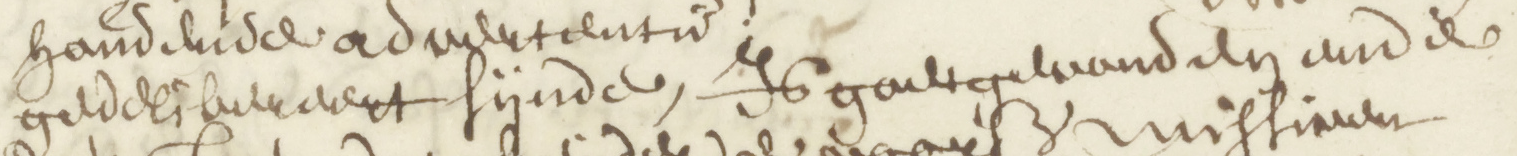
gedelibereert sijnde, Is goetgevonden ende
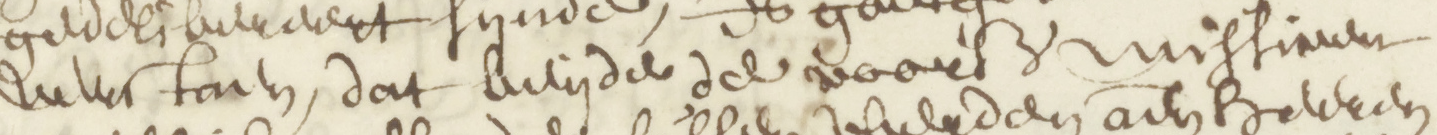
verstaen, dat beijde de voorsz Missiven
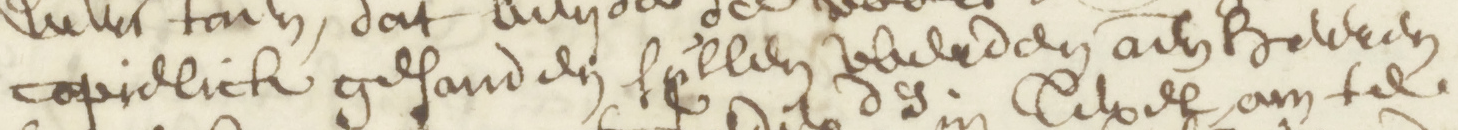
copielick gesonden sullen werden aen Heeren
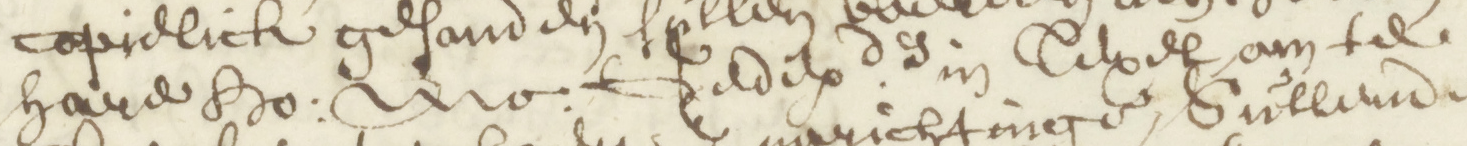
hare Ho:Mo: Gedepden in Texel om te
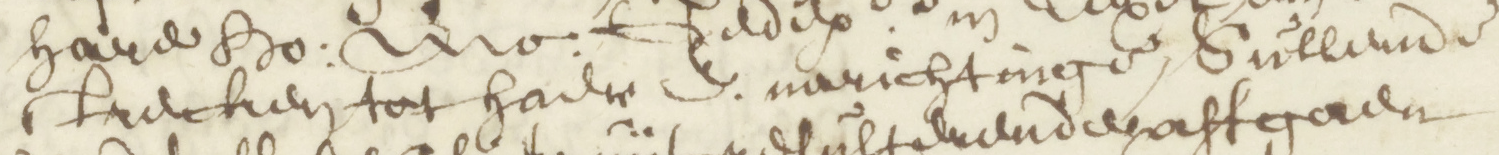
strecken tot haer E. narichtinge, Sullende
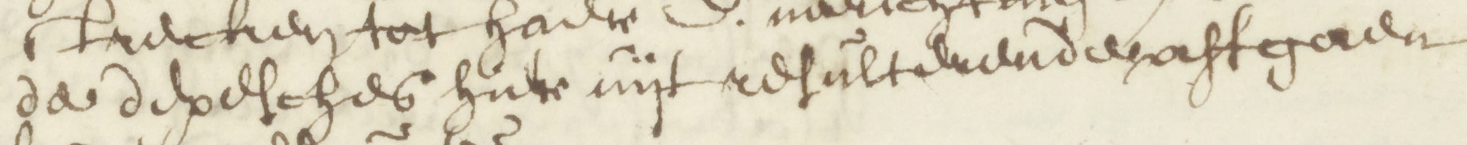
de depesches hier uijt resulterende, affgaen
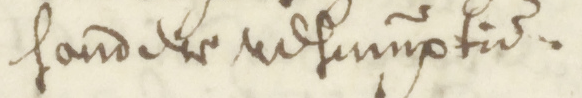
sonder resumptie.
